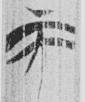天
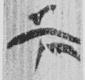下
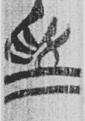爲
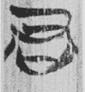君
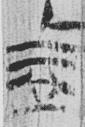者
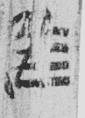隹（誰）
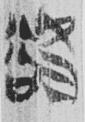欲
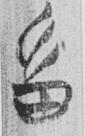畜
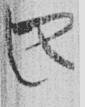女（汝）
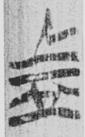者（諸）
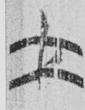才（哉）
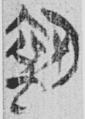初
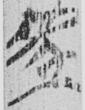○（吾）
